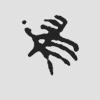群
